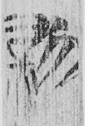則
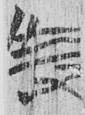拃（作）
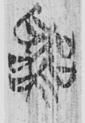○（亂）
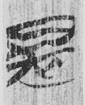是
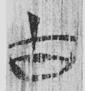古（故）
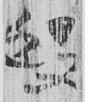臤（賢）
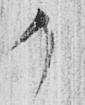人
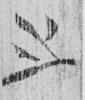之
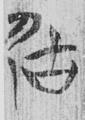居
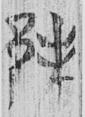邦
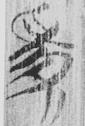○（家）
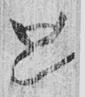也
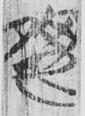○（夙）
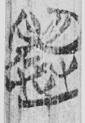○（興）
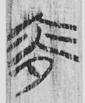夜
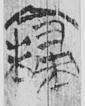○（寐）
